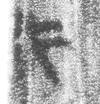夫
